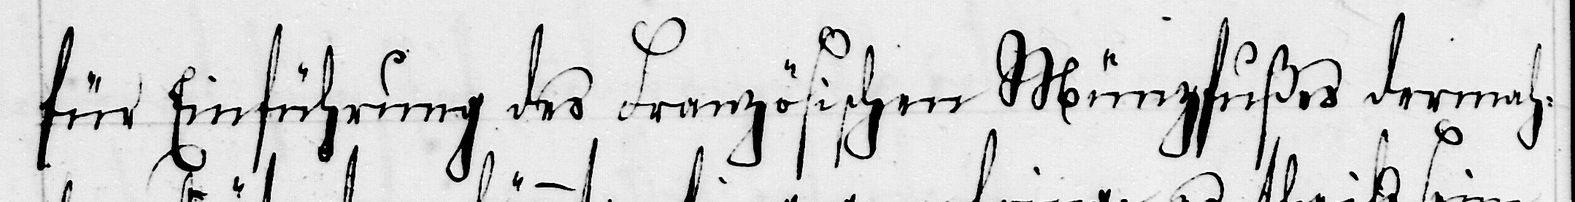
für Einführung des Französischen Münzfußes dermah¬
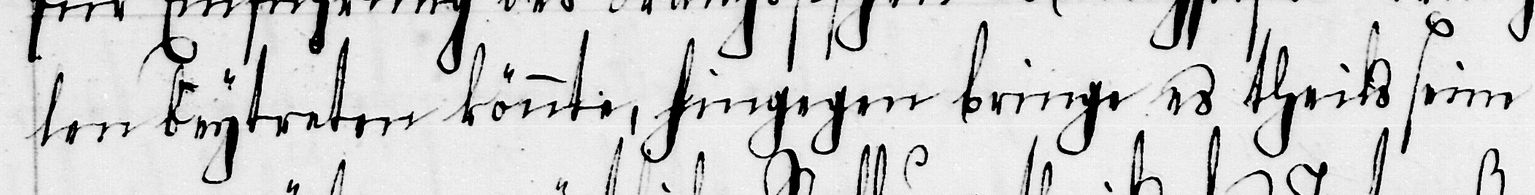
len beytreten könnte, hingegen bringe es theils seine
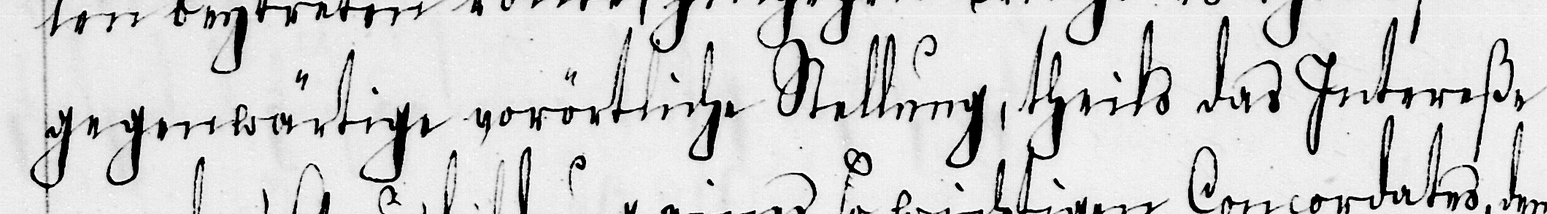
gegenwärtige vorörtliche Stellung, theils das Intereße
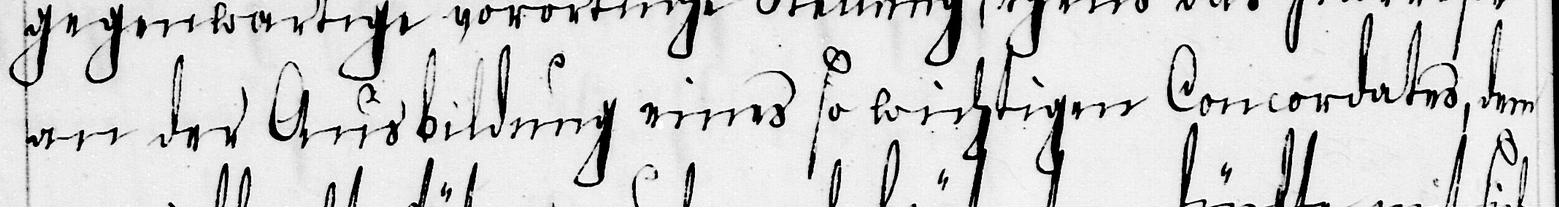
an der Ausbildung eines so wichtigen Concordates, dem
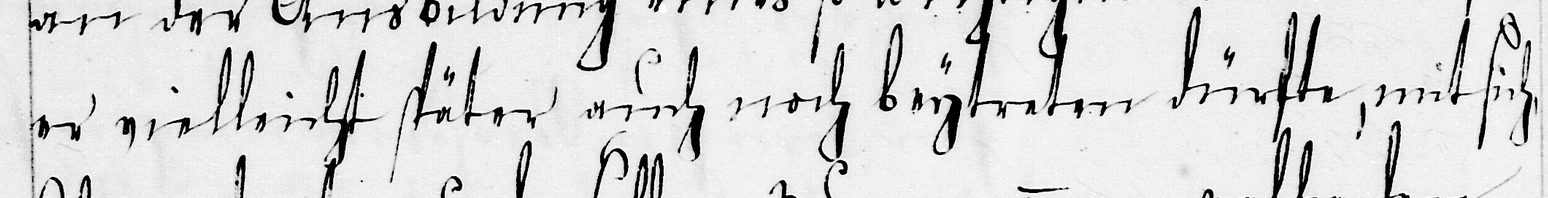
er vielleicht später auch noch beytreten dürfte, mit si¬
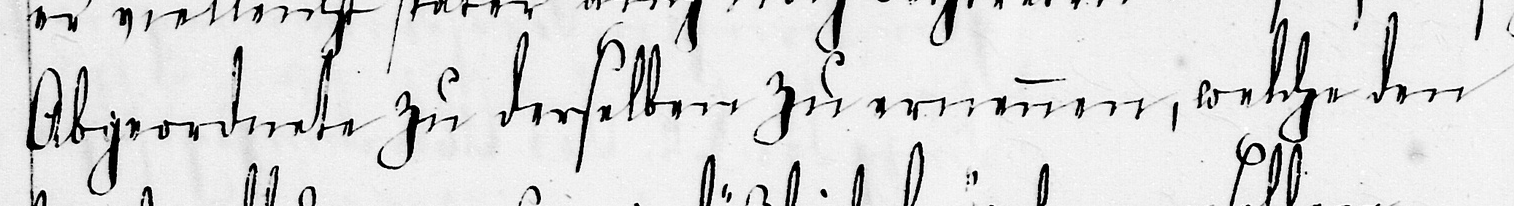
Abgeordnete zu derselben zu ernennen, welche den
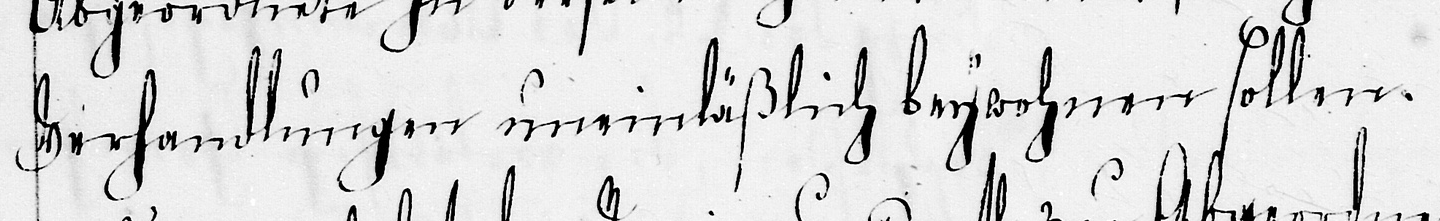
Verhandlungen uneinläßlich beywohnen sollen.
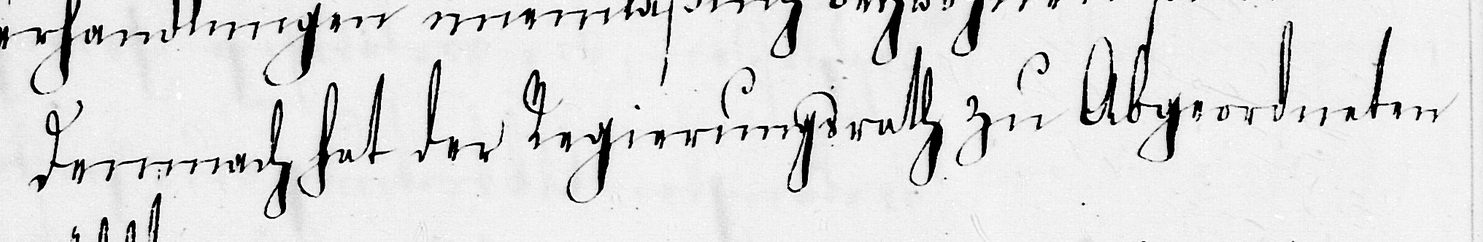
Demnach hat der Regierungsrath zu Abgeordneten
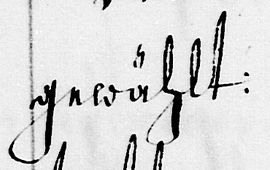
gewählt:
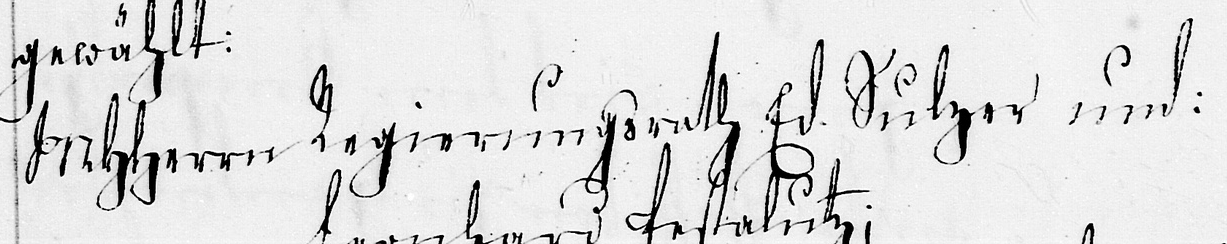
MHHerrn Regierungsrath Ed. Sulzer und:
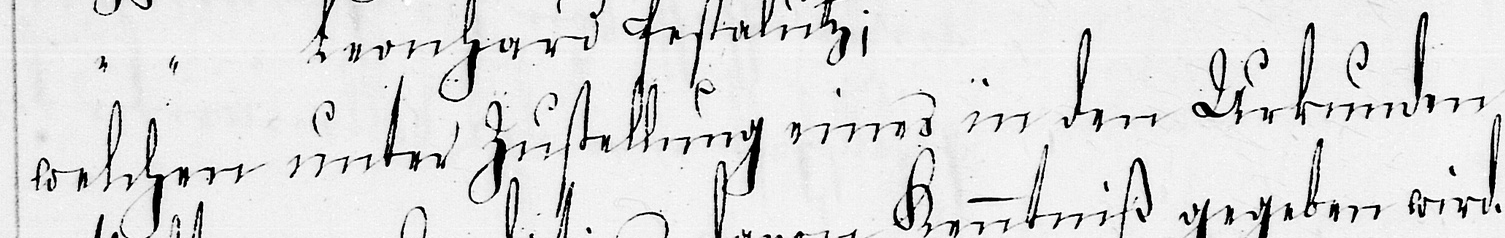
welchen unter Zustellung eines in den Urkunden
